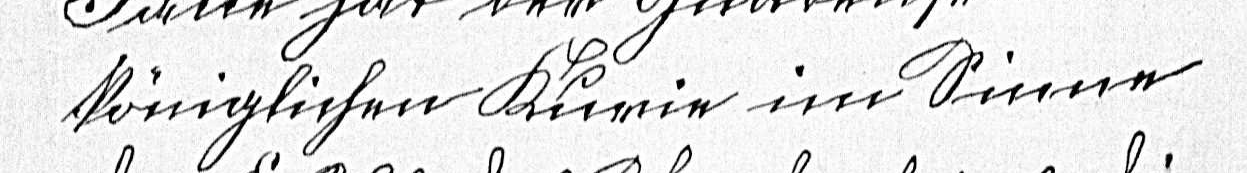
königliche Kurie im Sinne
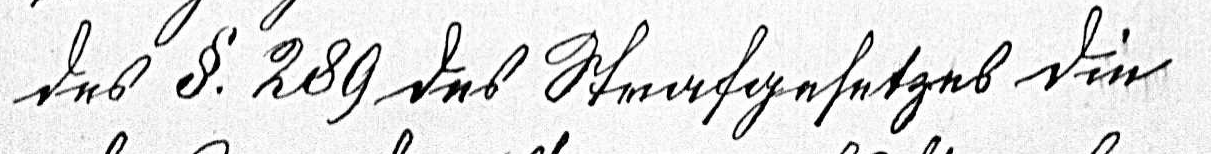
des §289 des Strafgesetzes die
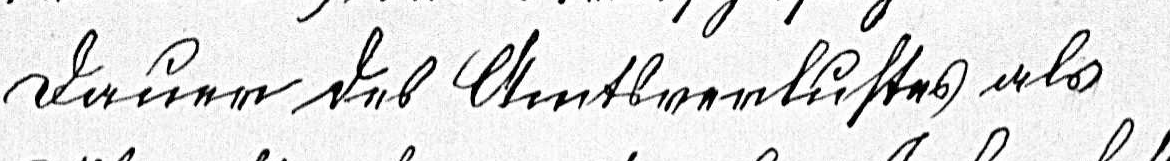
Dauer des Amtsverlustes als
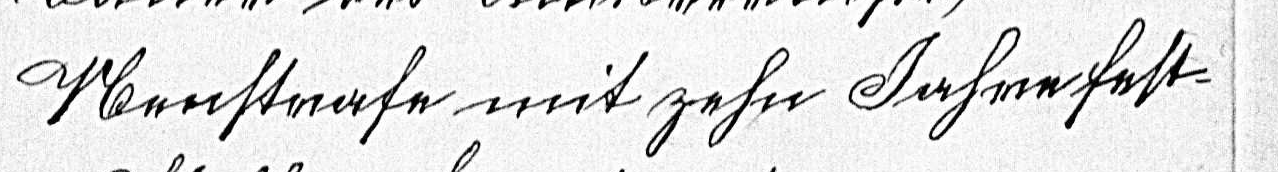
Ne[be]nstrafe mit zehn Jahre fest¬
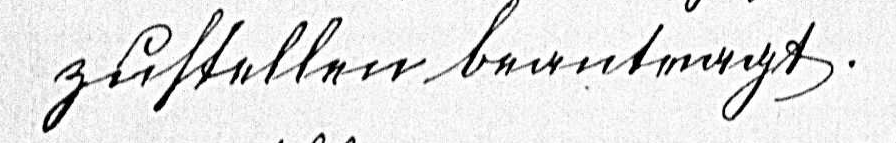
zustellen beantragt.
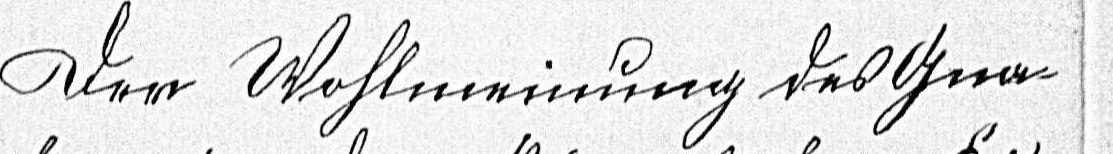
Der Wohlmeinung des Gna¬
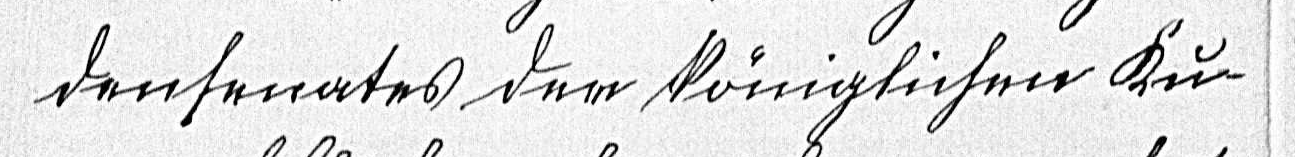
densenates der königlichen Ku¬
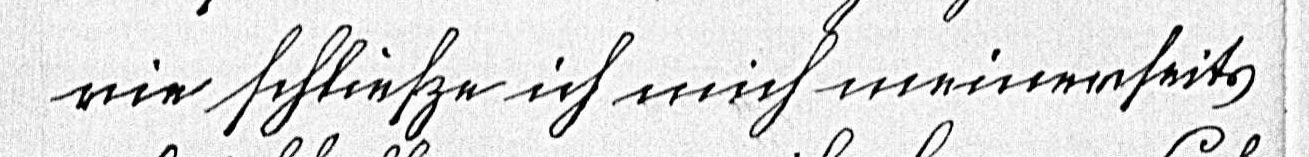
rie schließe ich mich meinerseits
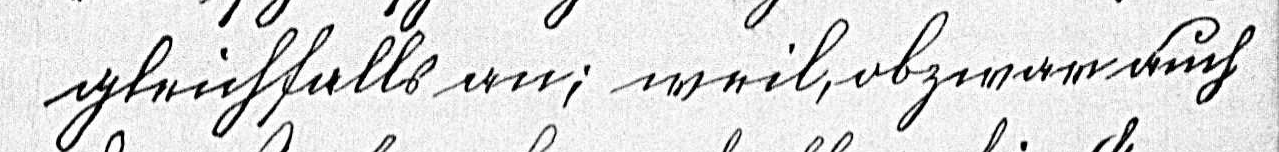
gleichfalls an; weil, obzwar auch
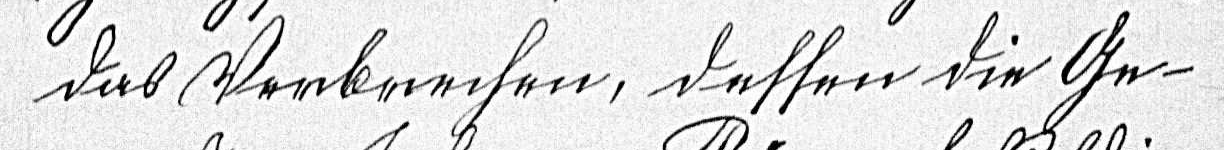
das Verbrechen, dessen die Ge¬
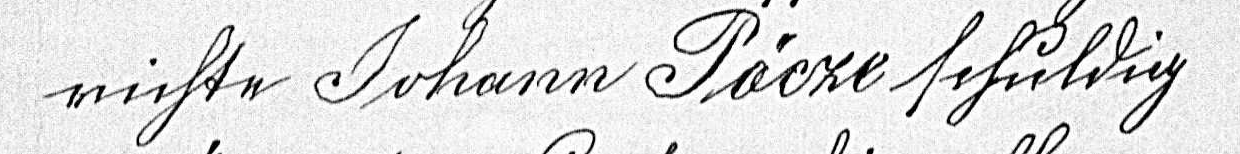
richte Johann Pöcze schuldig
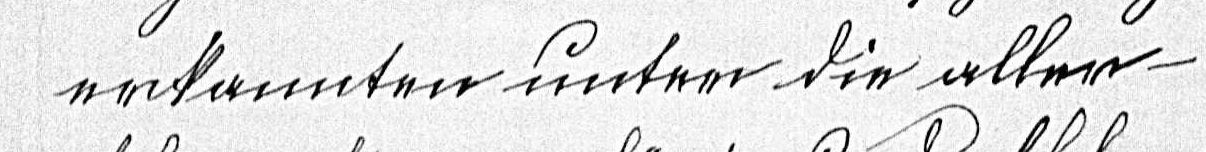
erkannten unter die aller¬
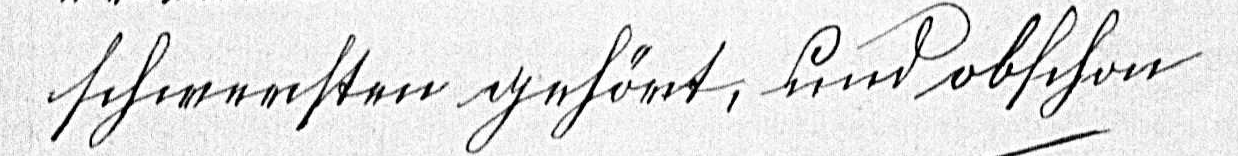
schwersten gehört, und obschon
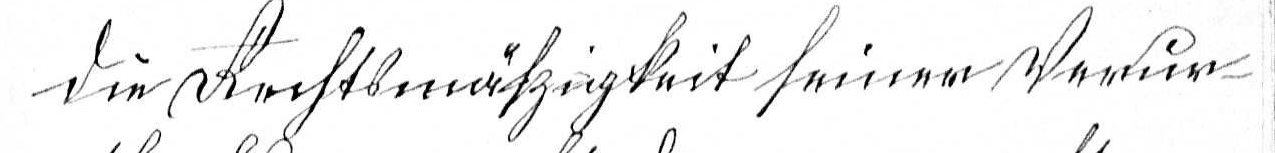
die Rechtsmäßigkeit seiner Verur¬
